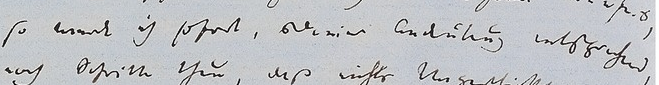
so werde ich sofort, Deiner Andeutung entsprechend,
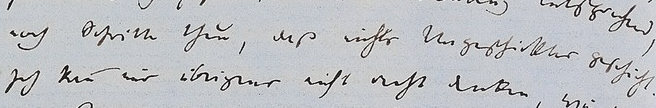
noch Schritte thun, daß nichts Ungeschicktes geschieht.
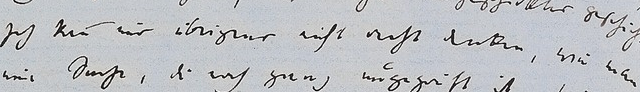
Ich kann mir übrigens nicht recht denken, wie man
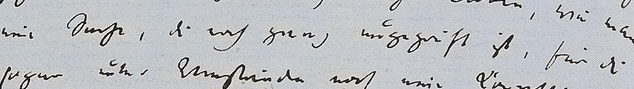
eine Sache, die noch ganz ungeprüft ist, für die
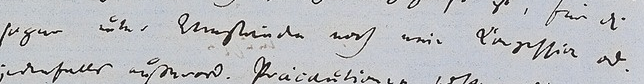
sogar unter Umständen noch eine Konzession od.
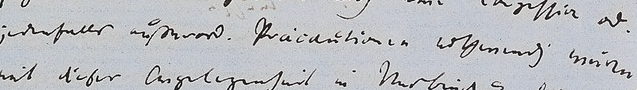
jedenfalls außerord. Präcautionen nothwendig wären,
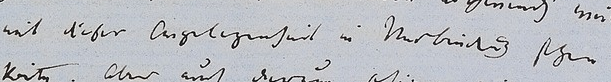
mit dieser Angelegenheit in Verbindung setzen
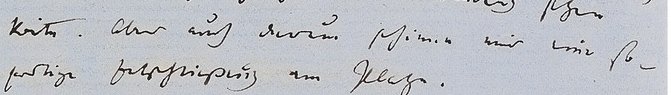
könnte. Aber auch darum schiene mir eine so-
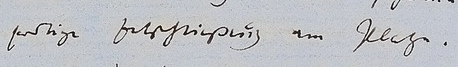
fortige Entschließung am Platze.
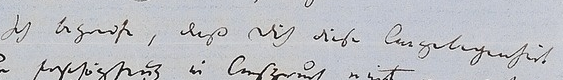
Ich begreife, daß Dich diese Angelegenheit
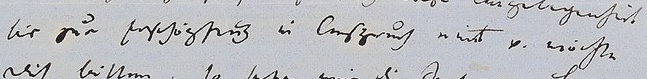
bis zur Erschöpfung in Anspruch nimmt &. möchte
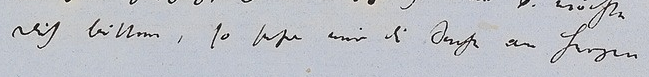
Dich bitten, so sehr mir die Sache am Herzen
